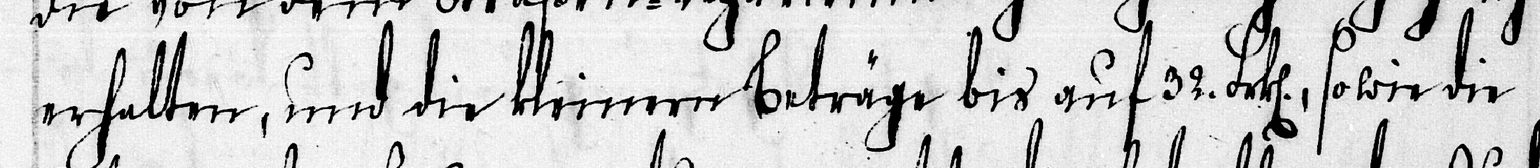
erhalten, und die kleinern Beträge bis auf 32. Frk[en]., sowie
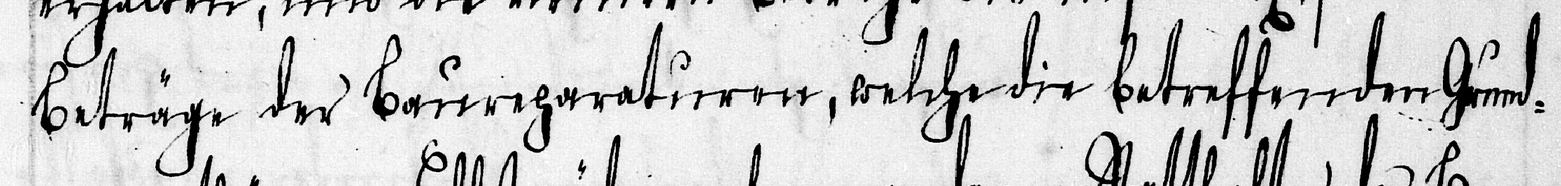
Beträge der Baureparaturen, welche die betreffenden Grund¬
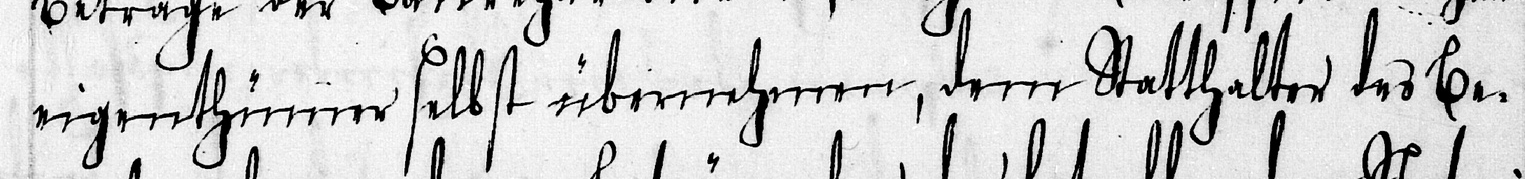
eigenthümer selbst übernehmen, dem Statthalter des Be¬
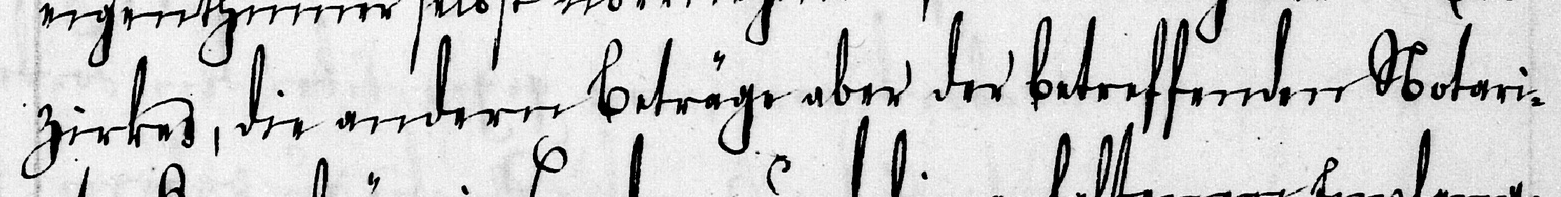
zirkes, die andern Beträge aber der betreffenden Notari¬
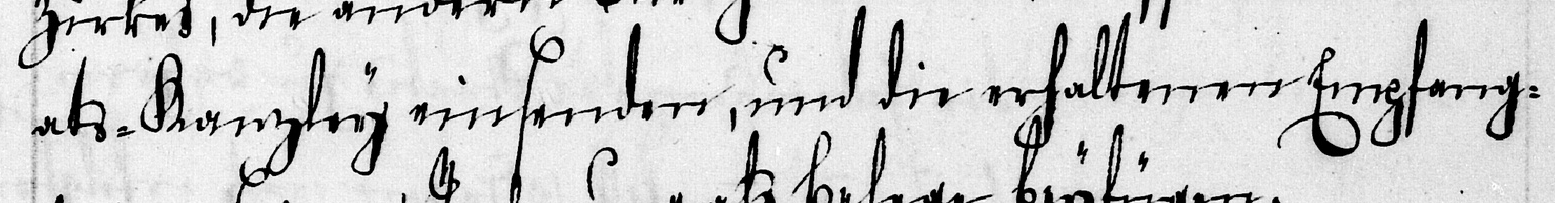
ats-Kanzley einsenden, und die erhaltenen Empfang¬
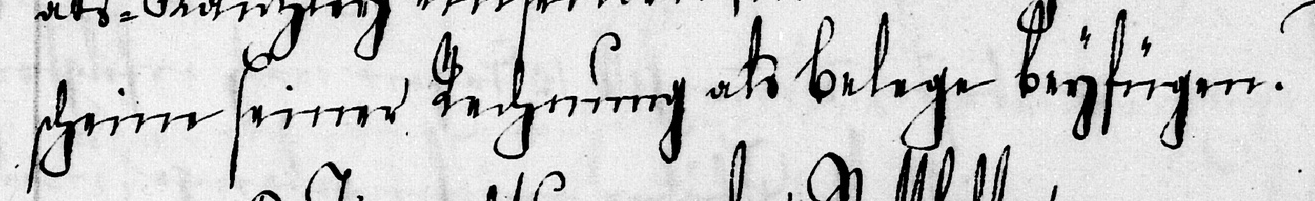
scheine seiner Rechnung als Belege beyfügen.
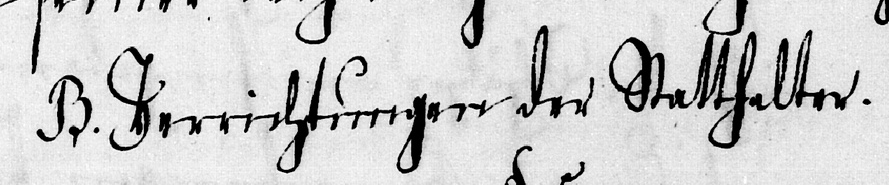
B. Verrichtungen der Statthalter.
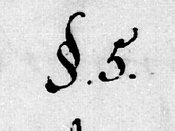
§. 5.
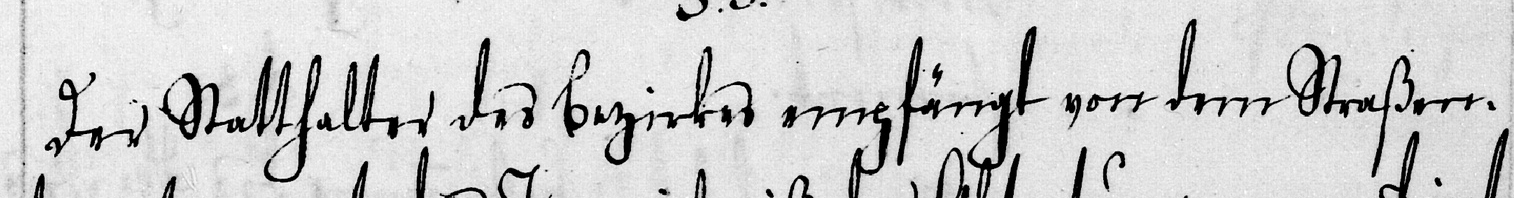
Der Statthalter des Bezirkes empfängt von dem Straßen¬
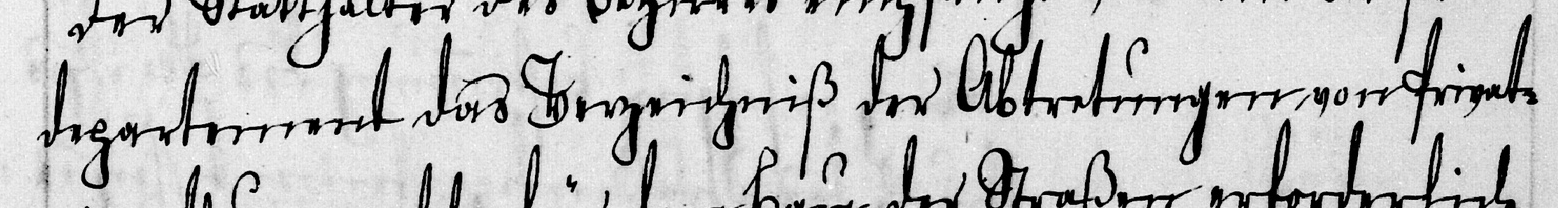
departement das Verzeichniß der Abtretungen von Privat¬
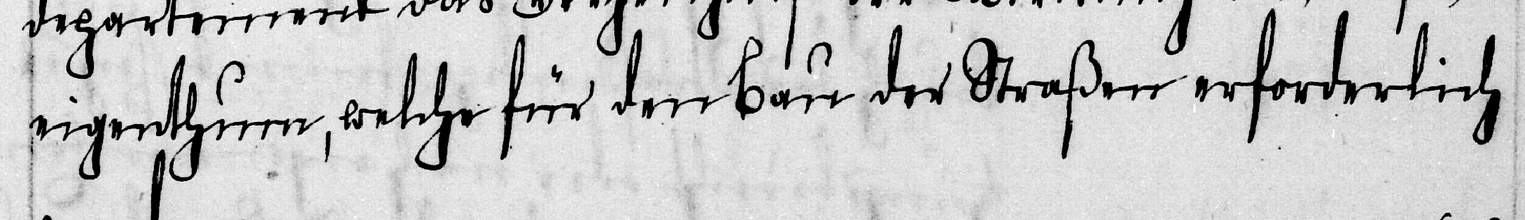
eigenthum, welche für den Bau der Straßen erforderlich
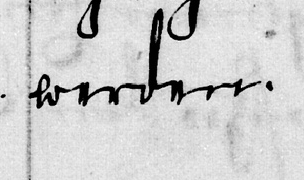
werden.
